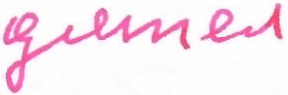дятел
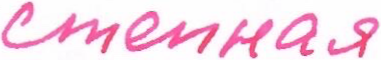степная
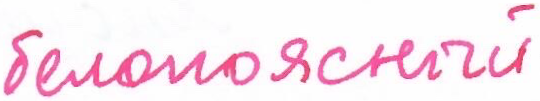белопоясный
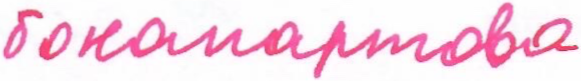бонапартова
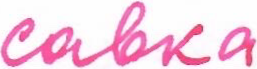савка
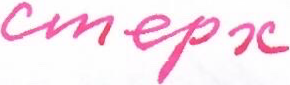стерх
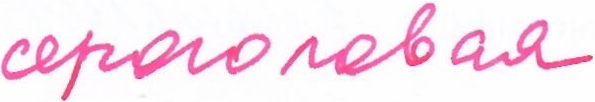сероголовая
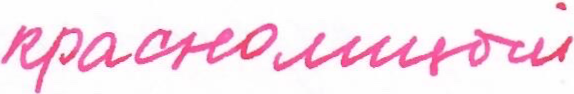краснолицый
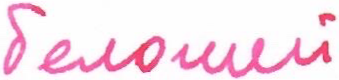белошей
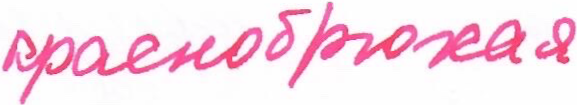краснобрюхая
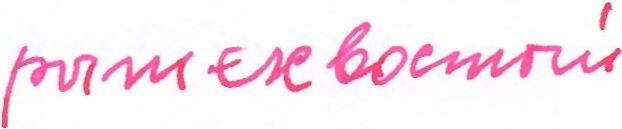рыжехвостый
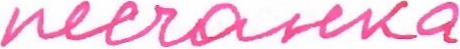песчанка
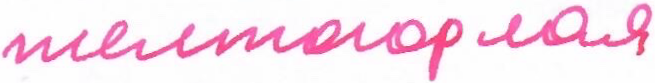желтогорлая
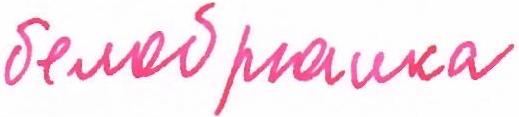белобрюшка
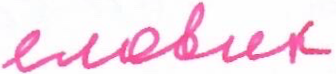еловик
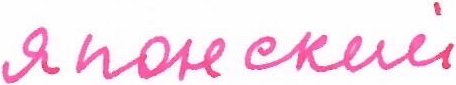японский
